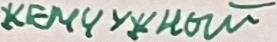жемчужный
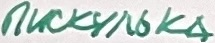пискулька
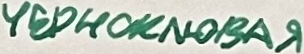черноклювая
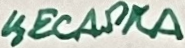цесарка
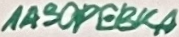лазоревка
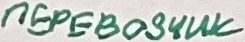перевозчик
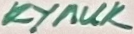кулик
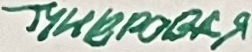тундровая
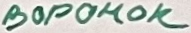воронок
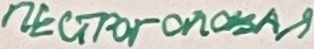пестроголовая
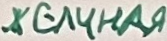желчная
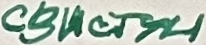свистун
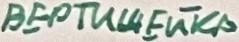вертишейка
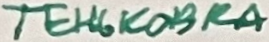теньковка
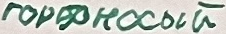горбоносый
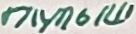глупыш
